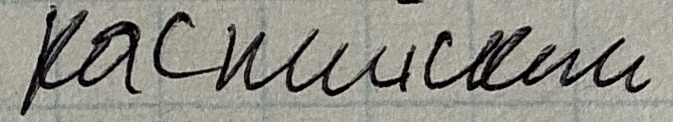каспийскии
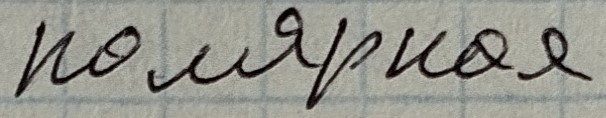полярная
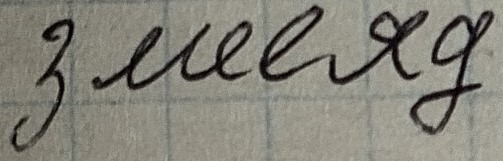змееяд
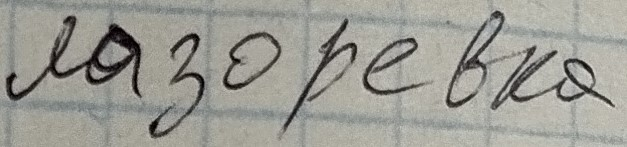лазоревка
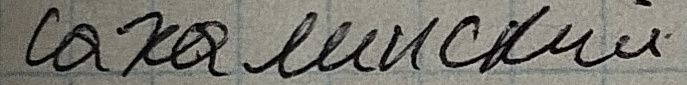сахалинский
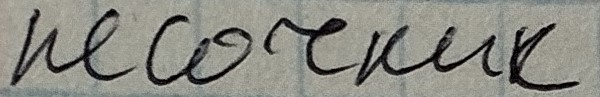песочник
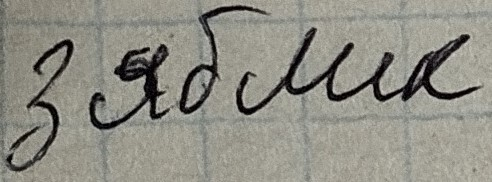зяблик
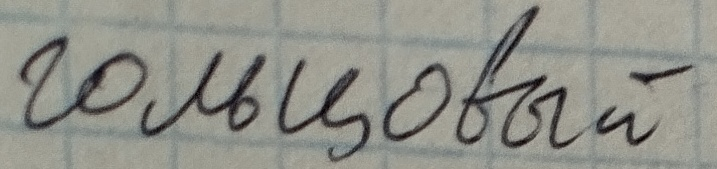гольцовый
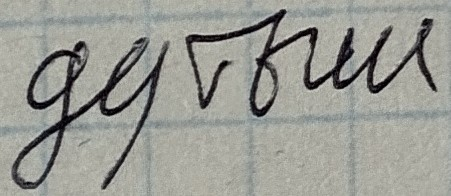дутыш
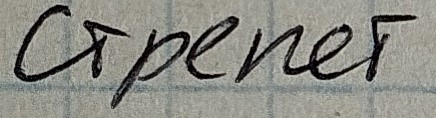стрепет
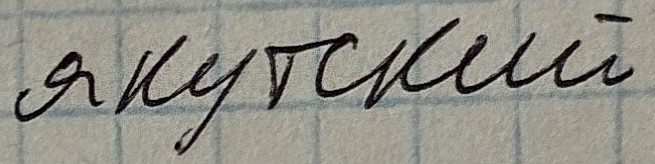якутский
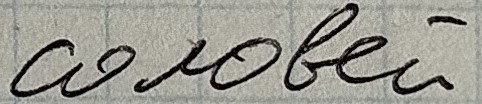соловей
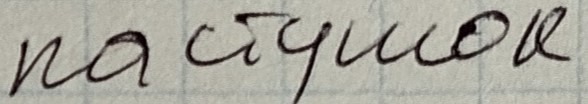пастушок
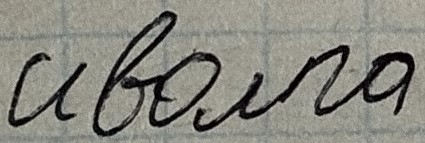иволга
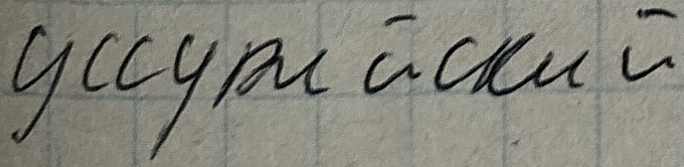уссурийский
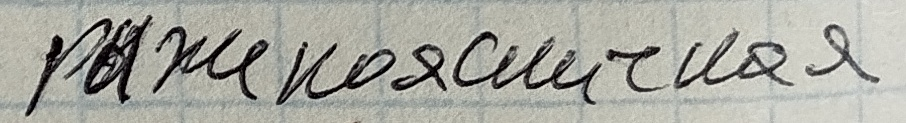рыжепоясничная
